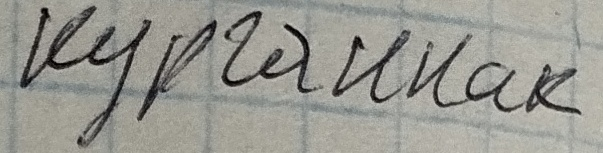курганник
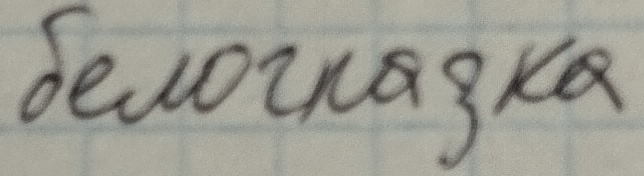белоглазка
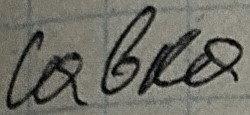савка
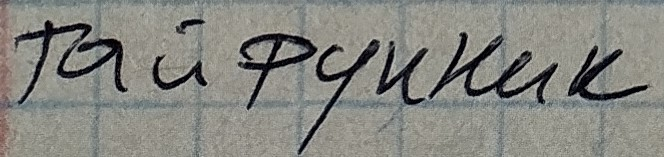тайфунник
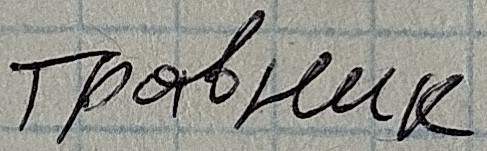травник
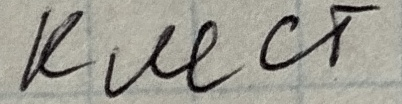клест
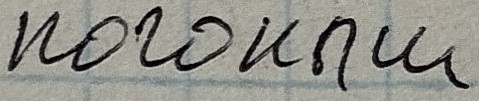погоныш
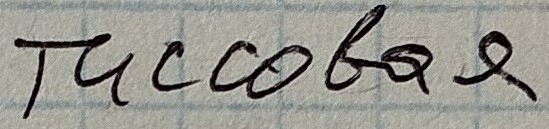тиссовая
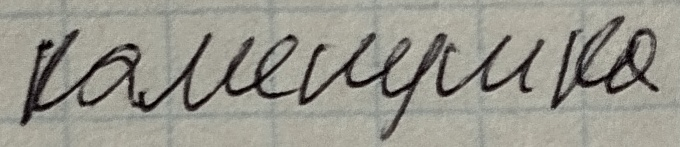каменушка
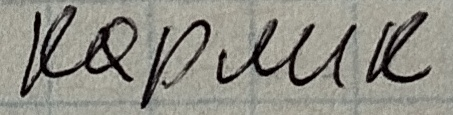карлик
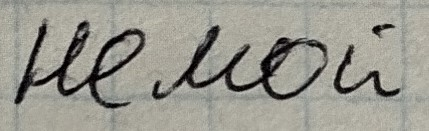немой
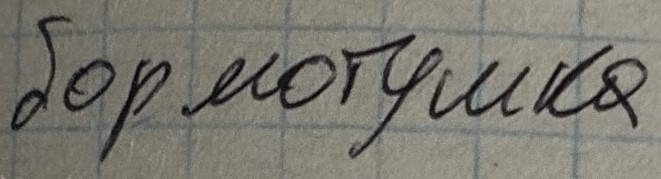бормотушка
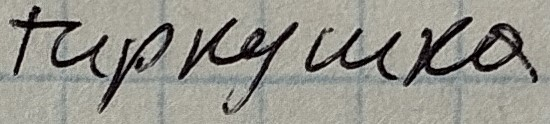тиркушка
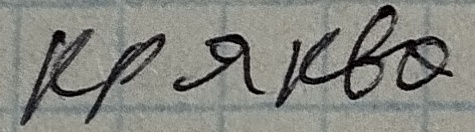кряква
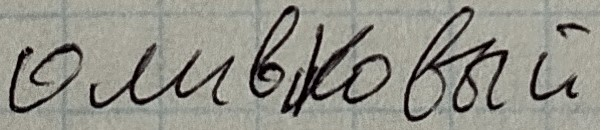оливковый
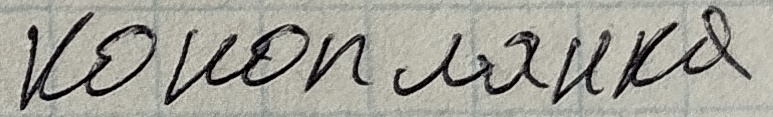коноплянка
